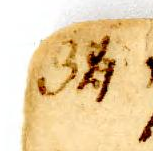34
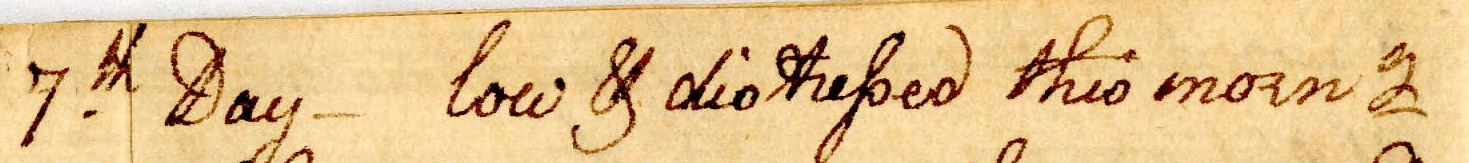7^th Day- low & distressed this morn^g
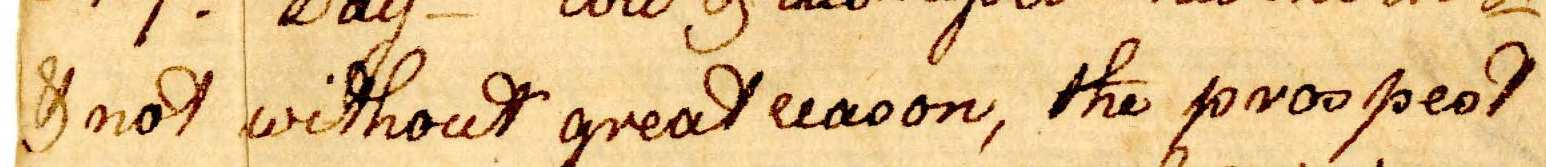& not without great reason, the prospest
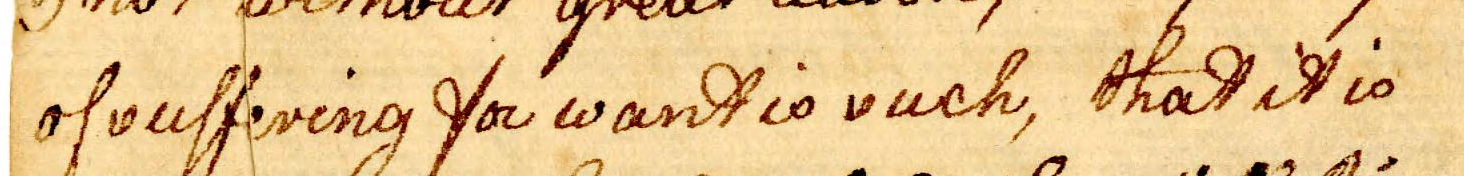of suffering for want is such, that it is
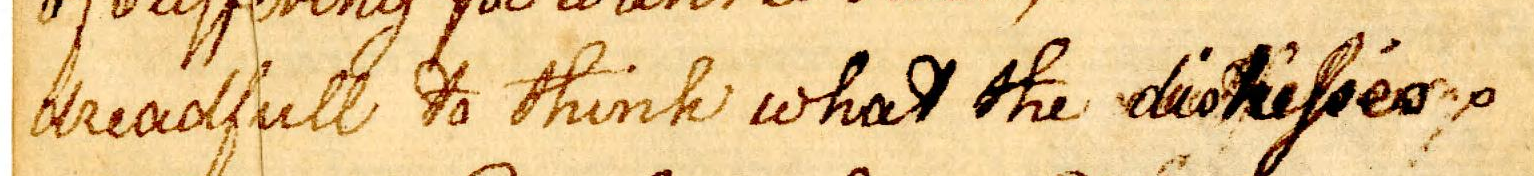dreadfull to think what the distresses
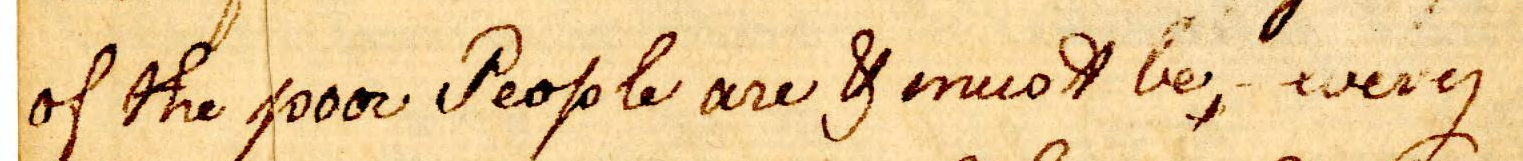of the poor People are & must be, every
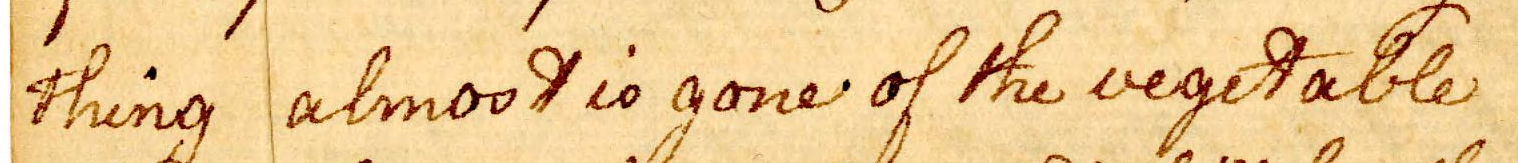thing almost is gone of the vegetable
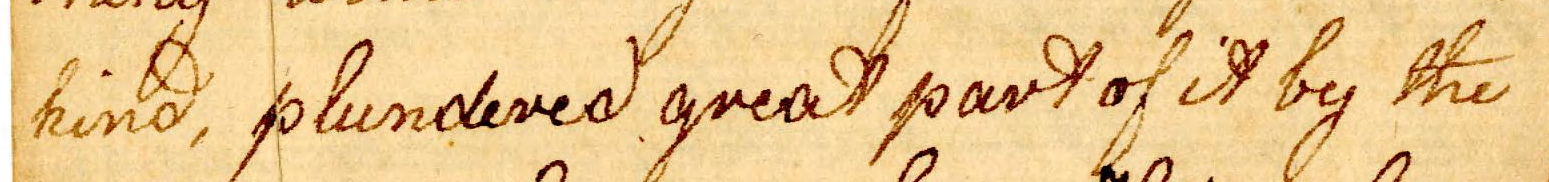kind, plundered great part of it by the
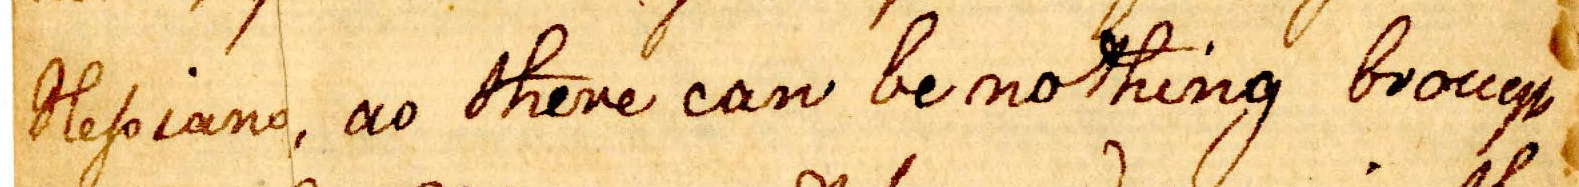Hessians, as there can be nothing brougs
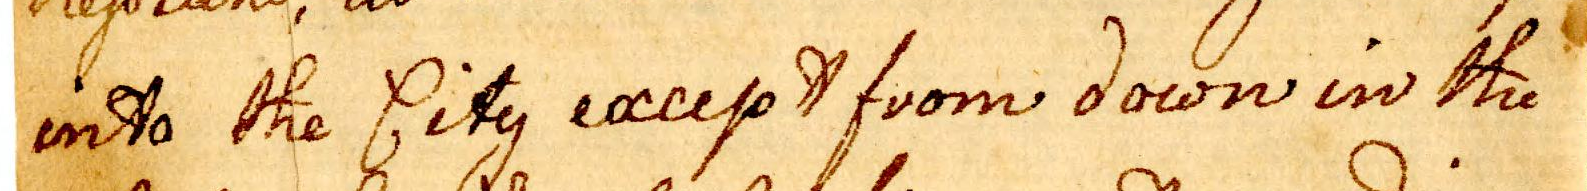into the City except from down in the
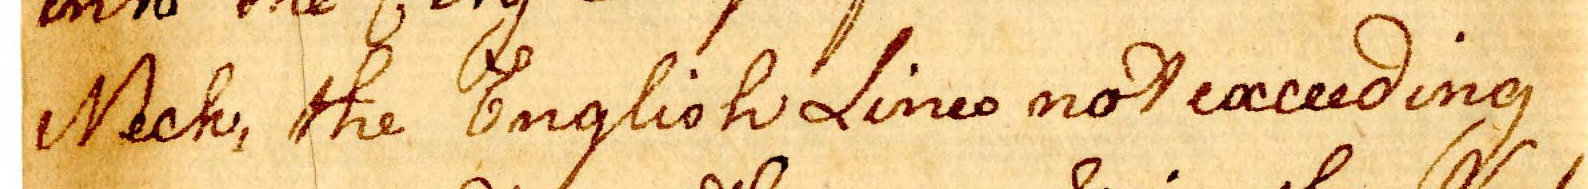Neck, the English Lines not exceeding
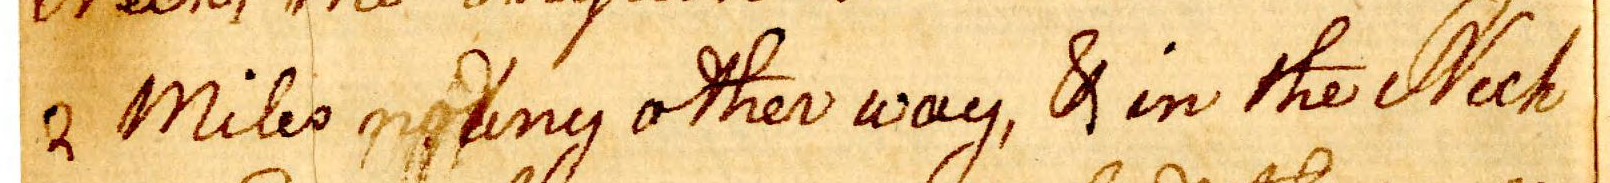2 Miles noting other way, & in the Neck
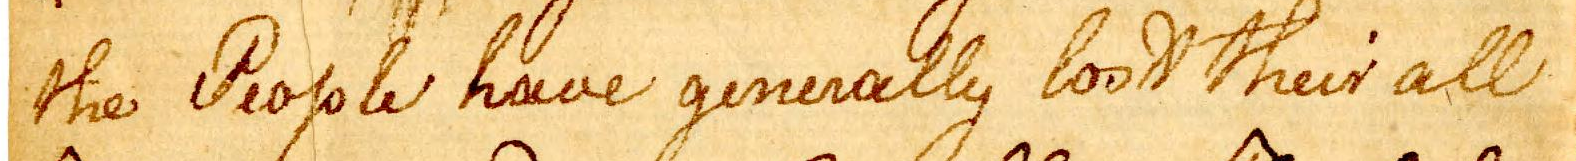the People have generally lost their all
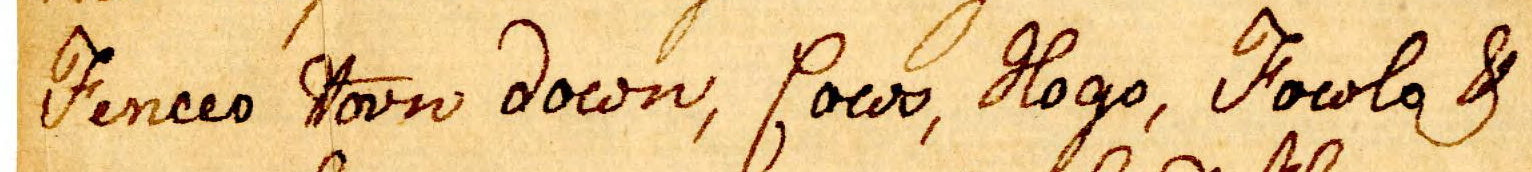Fences torn down, Cows, Hogs, Fowls &
